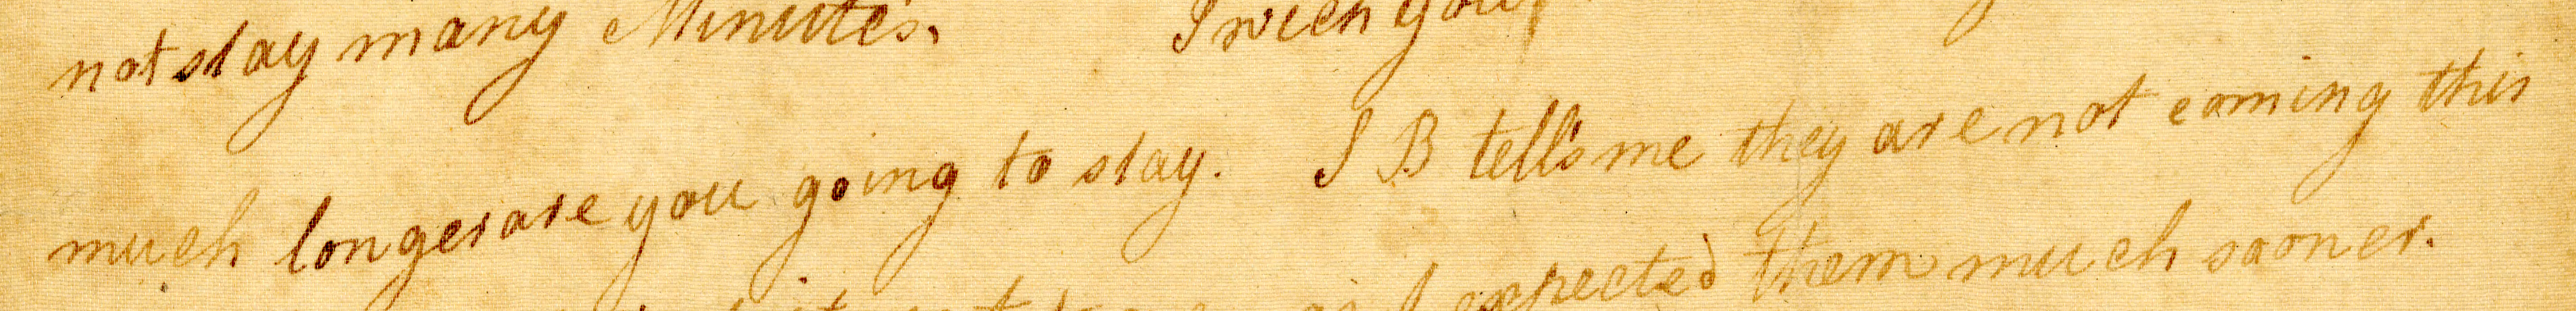much longer are you going to stay. SB tells me they are not coming this
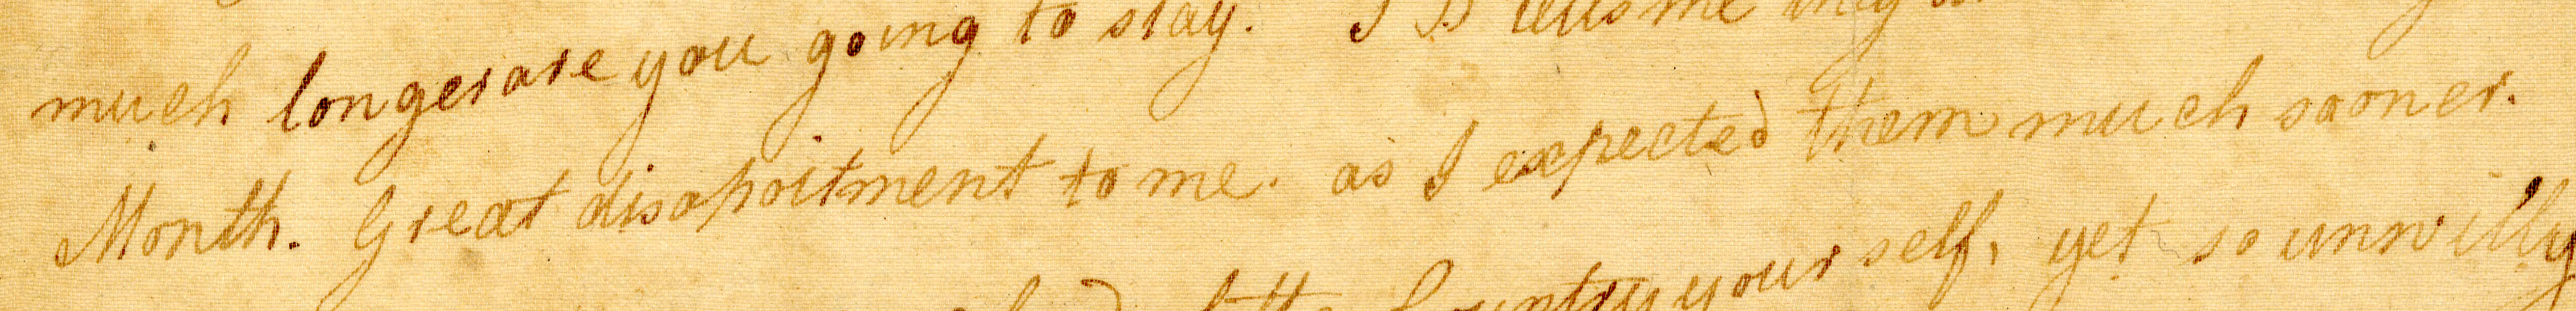Month. Great disapoitment to me as I expected them much sooner.
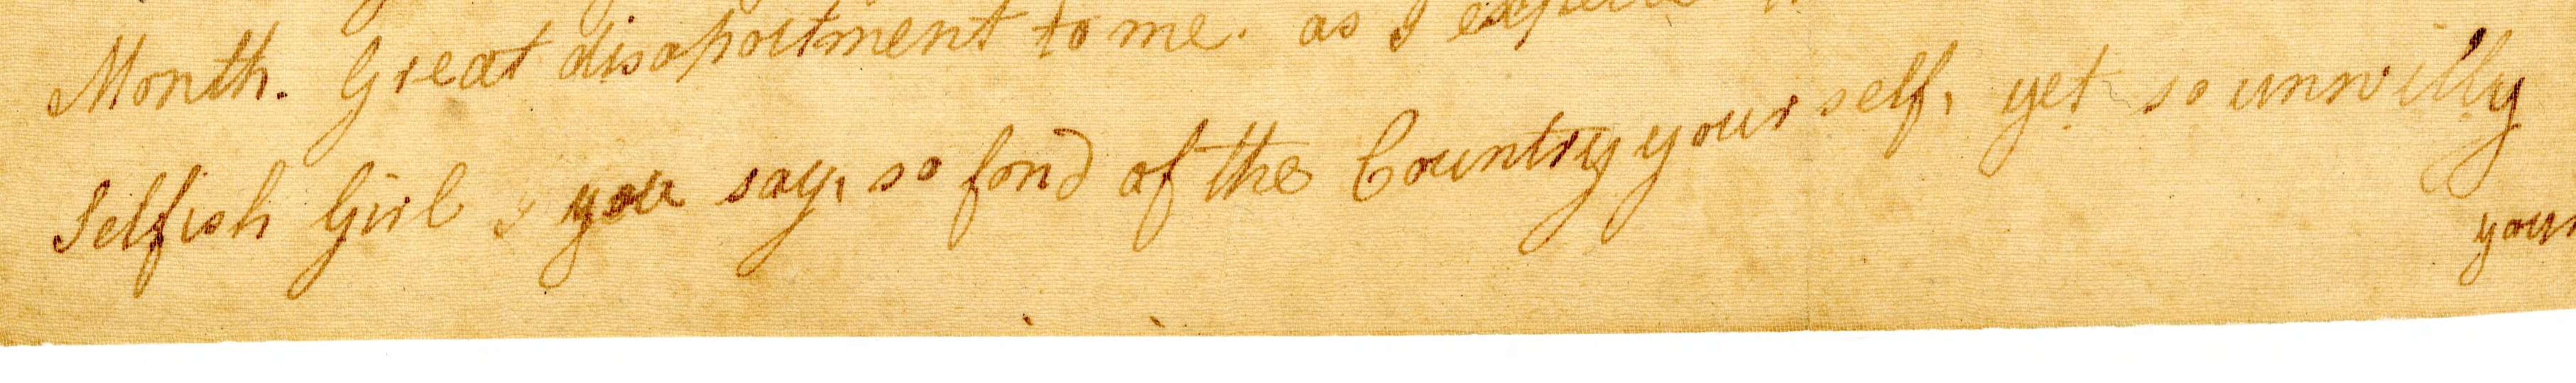Selfish Girl you say so fond of the Country yourself yet so unwillg
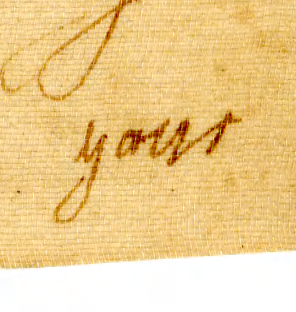your
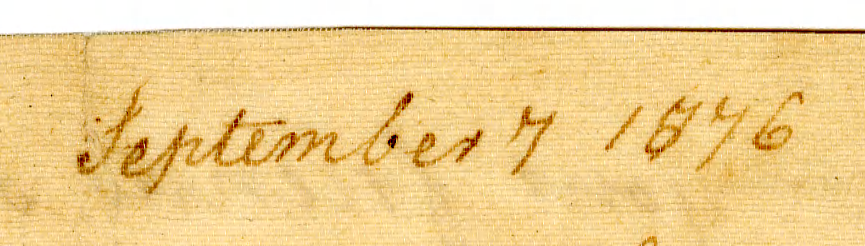September 7 1776
